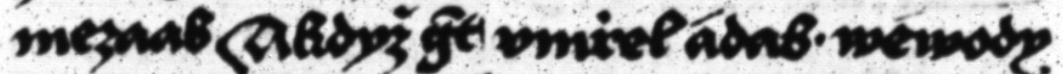meznal A když ḡt vmṙel ádab. wéwody
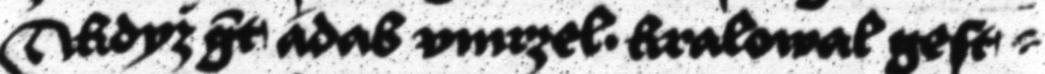když ḡt ádab vmrzel. kralowal geſt
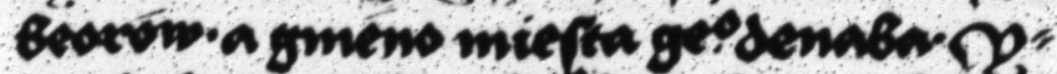beorów. a gméno mieſta ge° denaba. Y
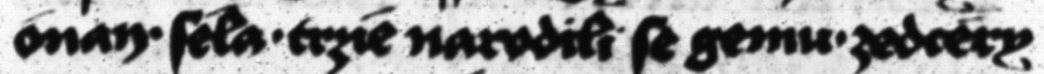ónan. ſéla. trzíe narodili ſe gemu. zedcéry
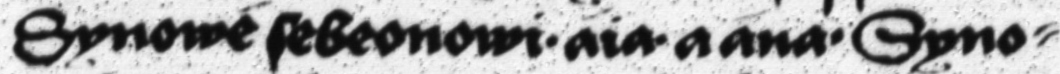Synowé ſebeonowi. áia. a ána. Syno
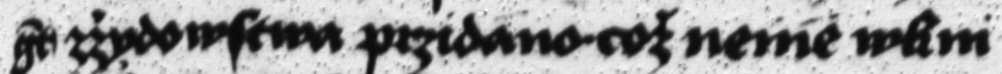ḡt zžydowſtwa przidáno. což neṅíe wkni
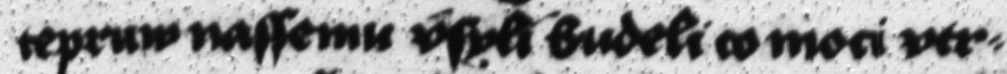tepruw naſſemu v́ſylí budeli co moci vtr
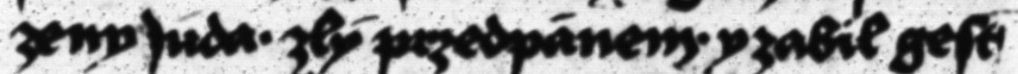zeny Iúda. zlý przedpánem. y zabil geſt
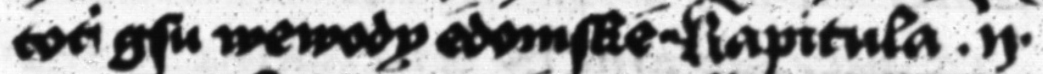toṫ gſu wewody édomſké Kapitula. ii.
